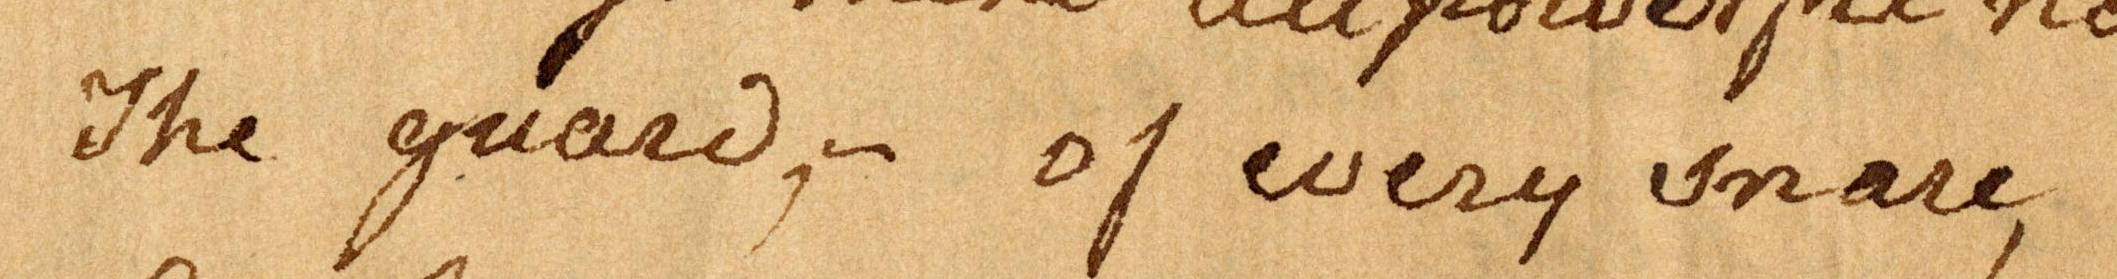The guard,- of every snare,
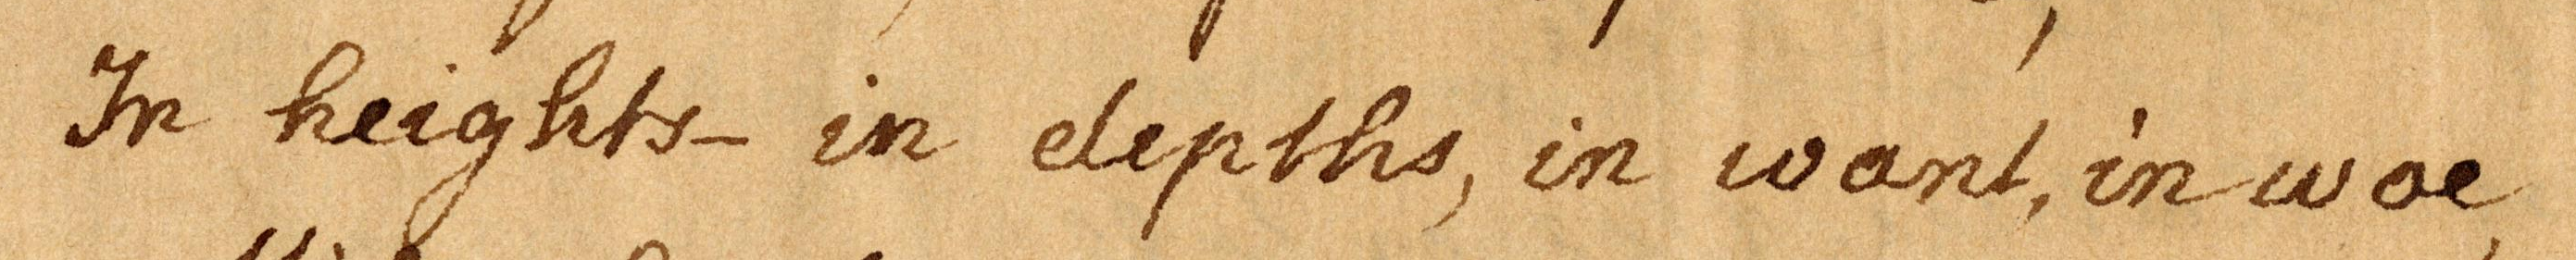In heights- in depths, in want, in woe,
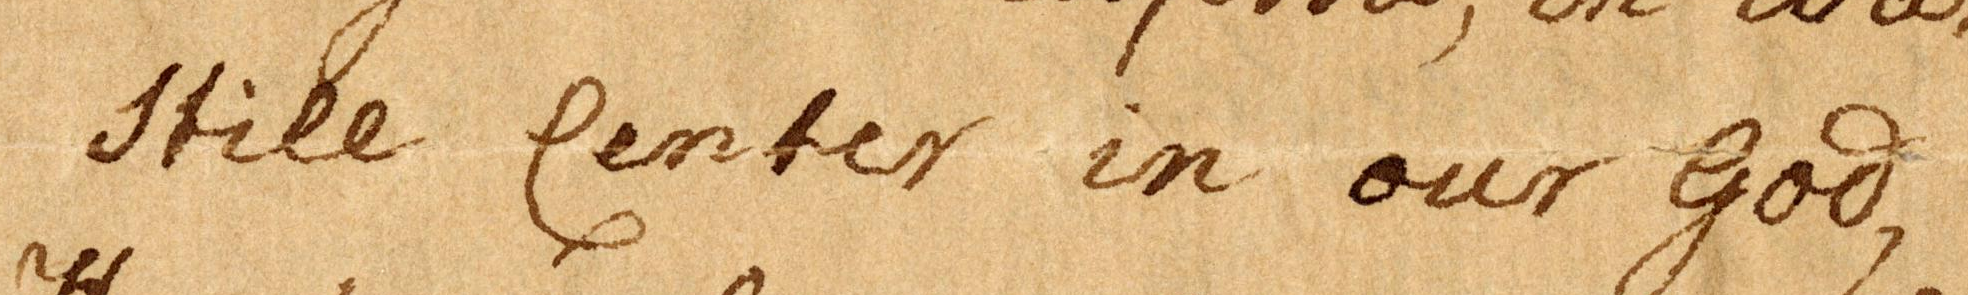Still Center in our God,
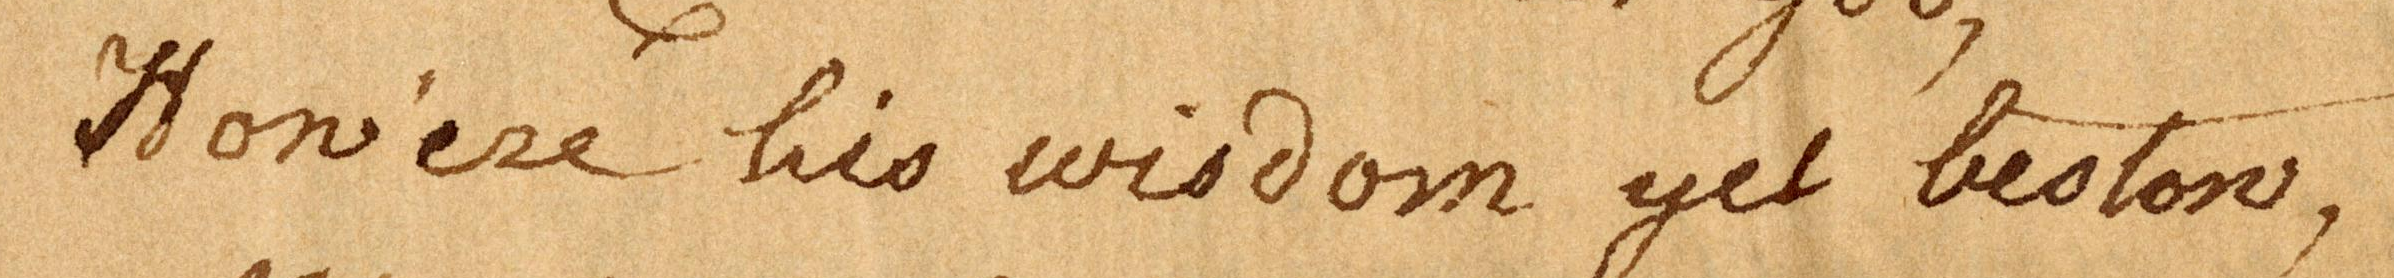How'ere his wisdom yet bestow,
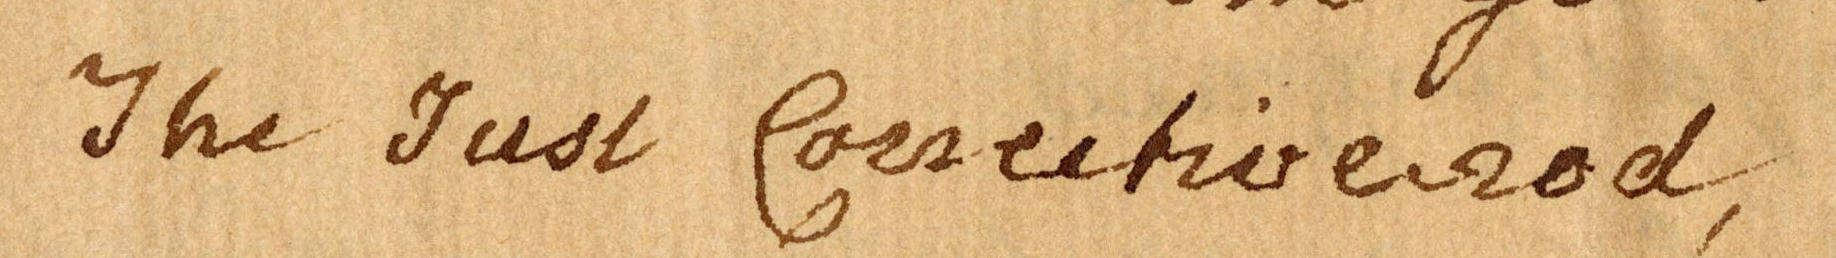The Just Corrective rod,
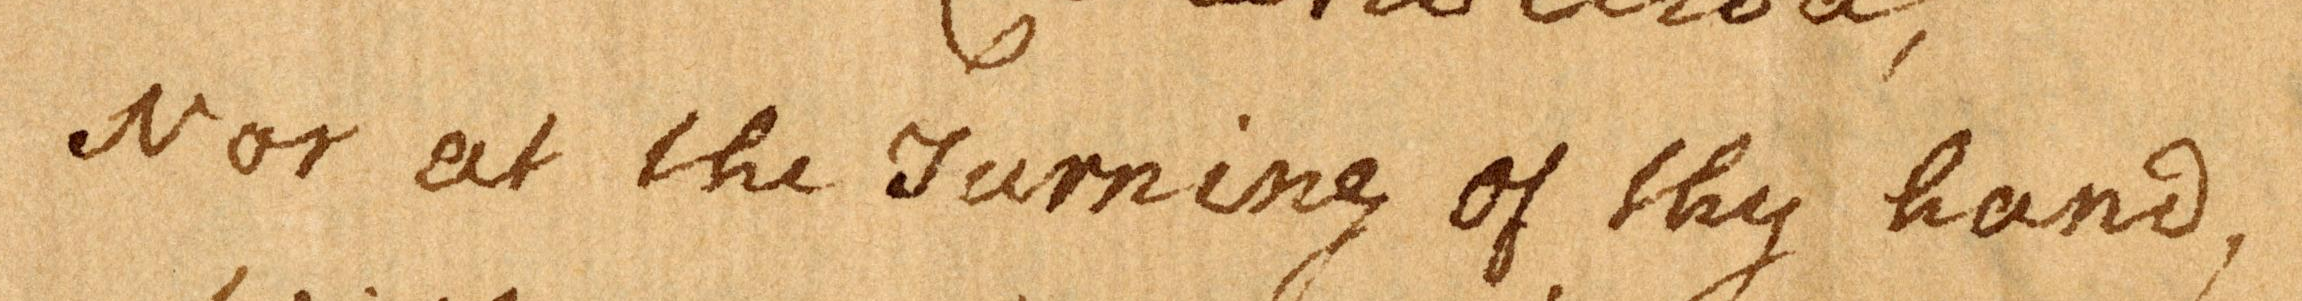Nor at the Turning of thy hand,
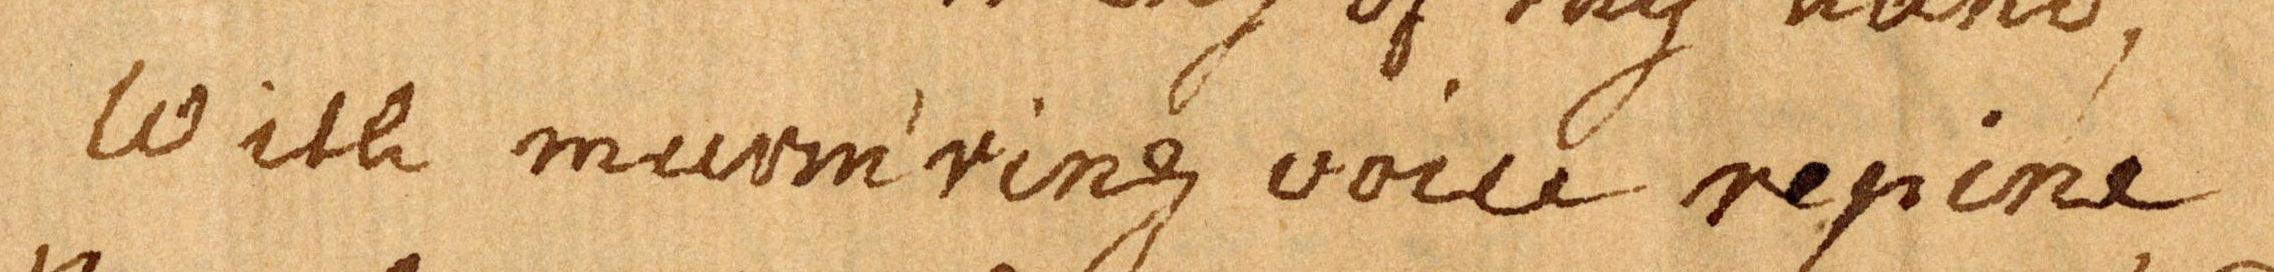With murm'ring voice repine,
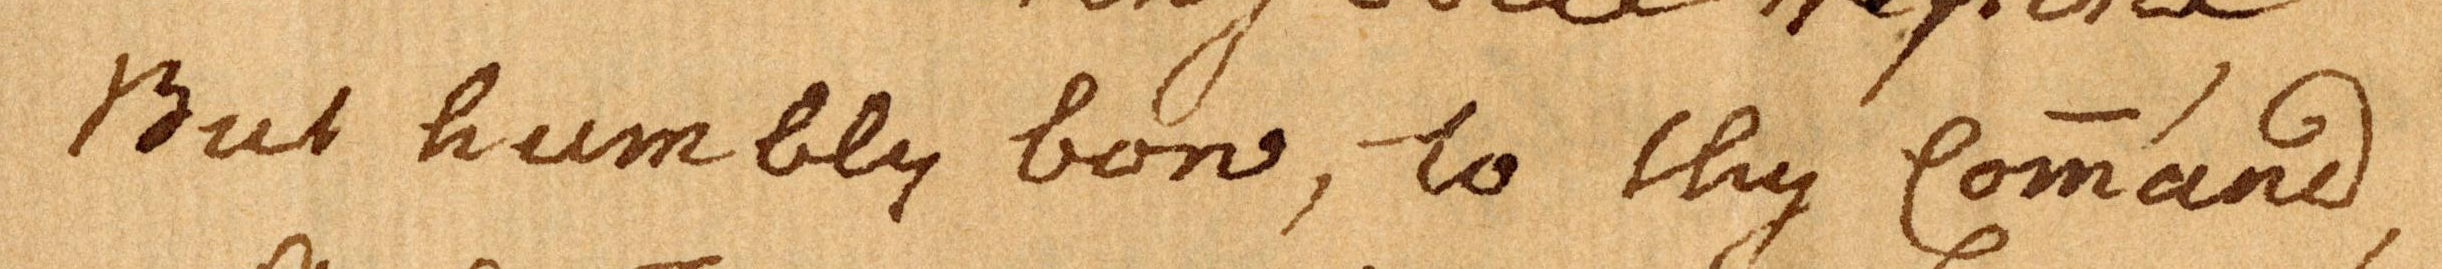But humbly bow, to thy Comand,
